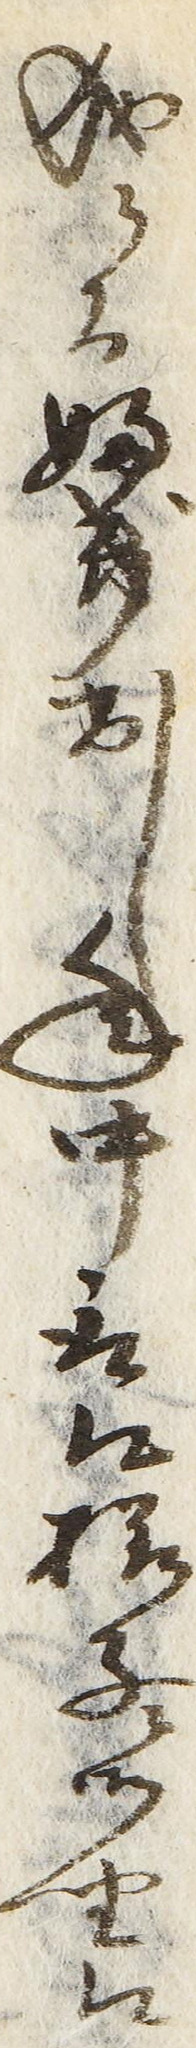成ニ而ふき出し年中取候様子ニ御座候
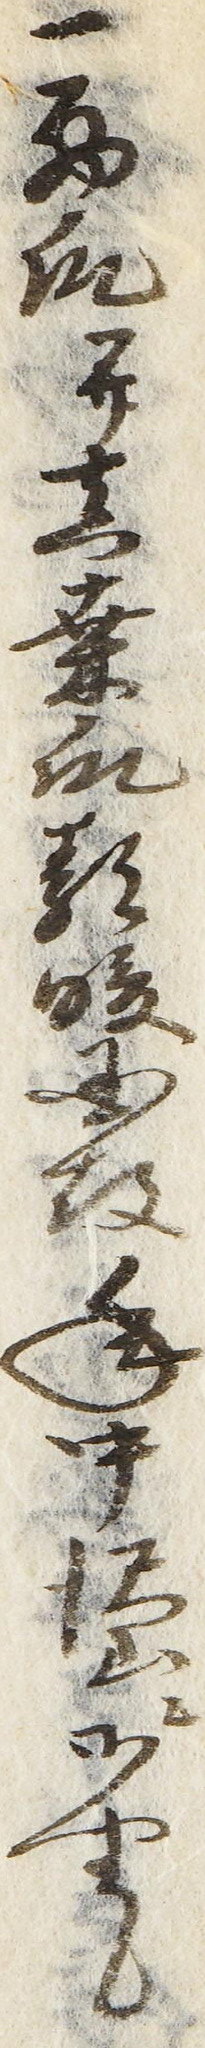一西瓜幷真桑瓜類暖国故年中沢山ニ御座候
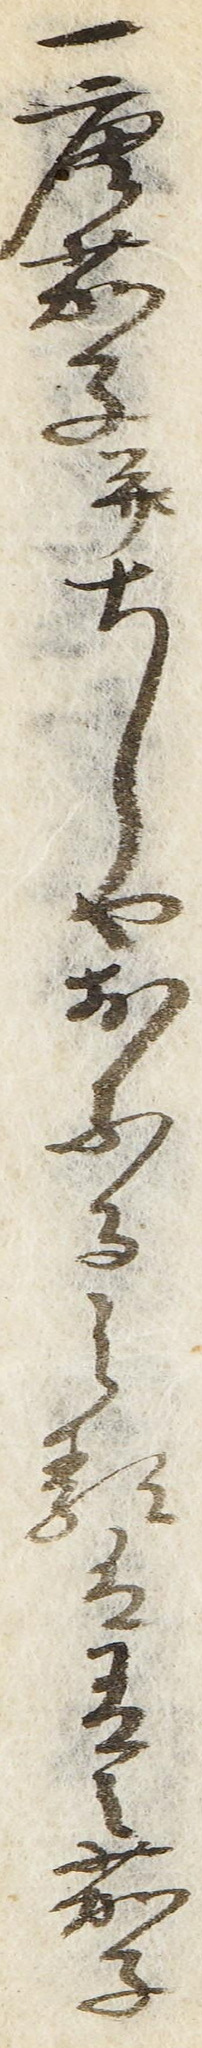一唐茄子幷ちしやなふるの類者有之茄子
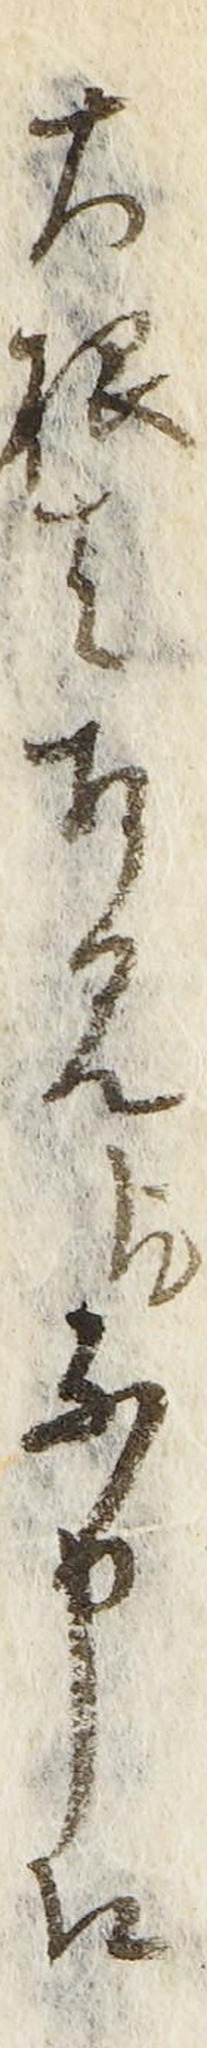大根者相見江不申候
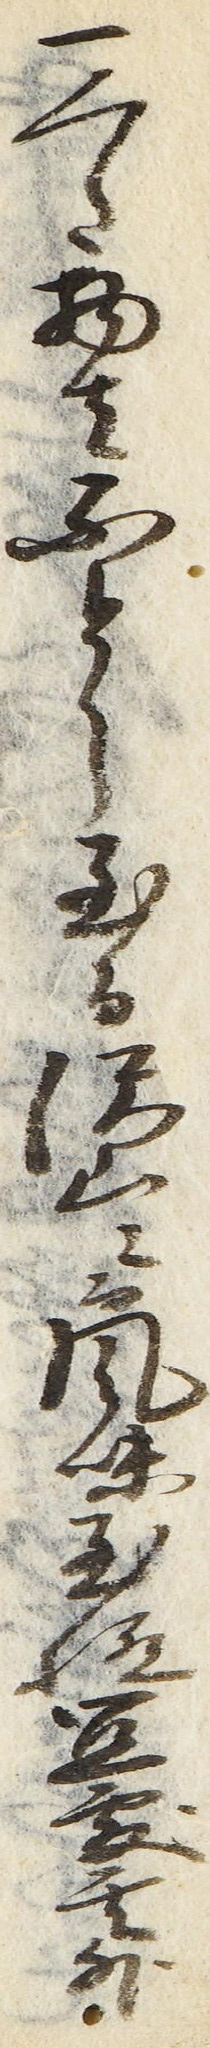一くた物者ふとく至而沢山ニ而風味至極宜敷其外

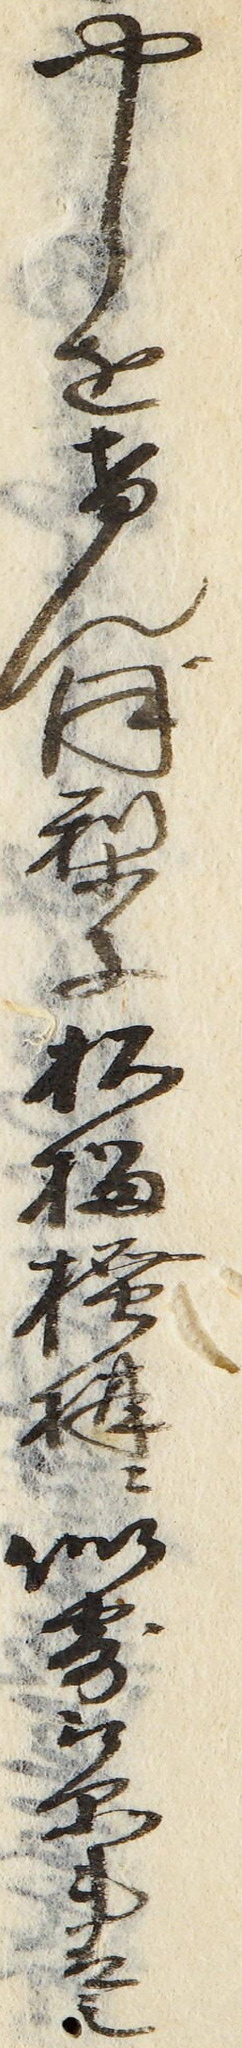やしをけんぼ梨子柘榴橙柑ニ似寄候品も有之
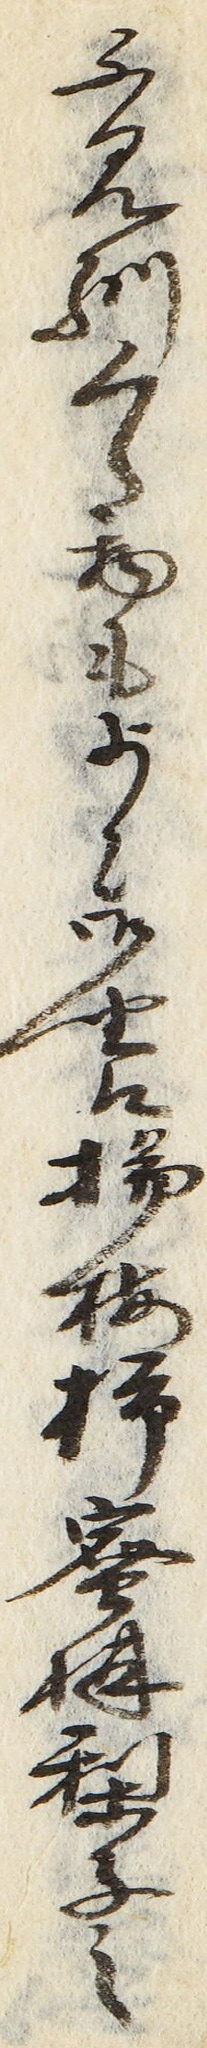不見馴くた物もよく御座候楊梅柿蜜柑梨子之
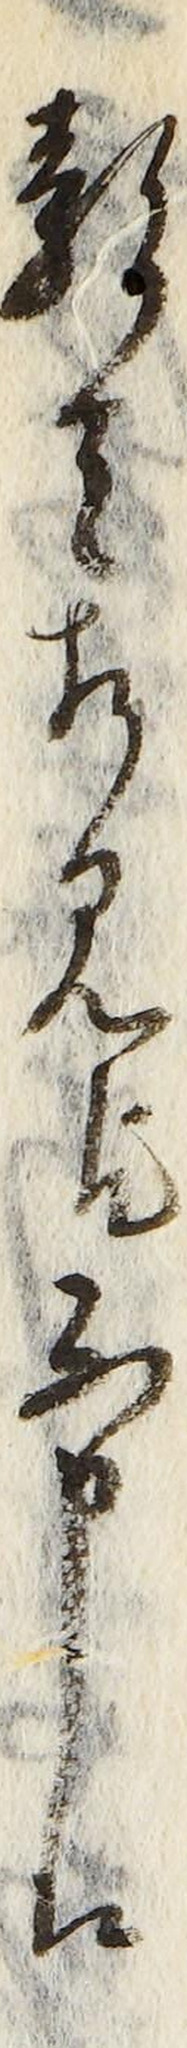類者相見江不申候
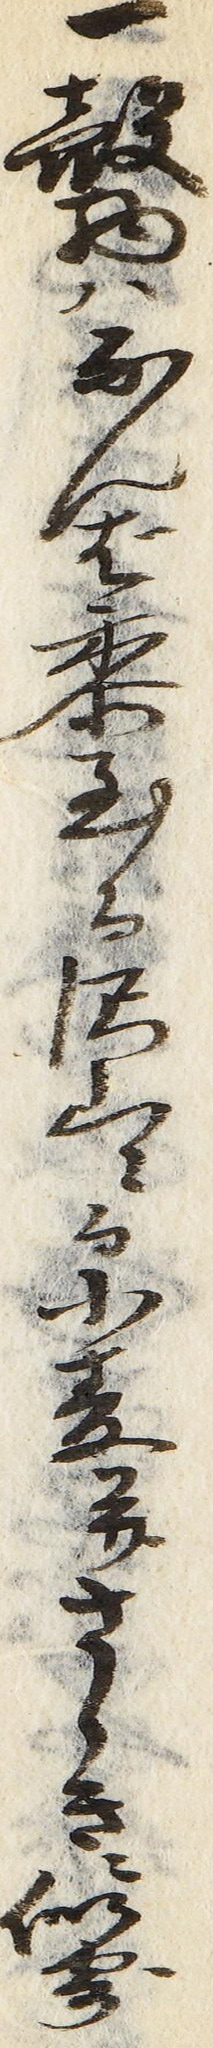一穀物ハなんば黍至而沢山ニ而小麦幷さゝきニ似寄
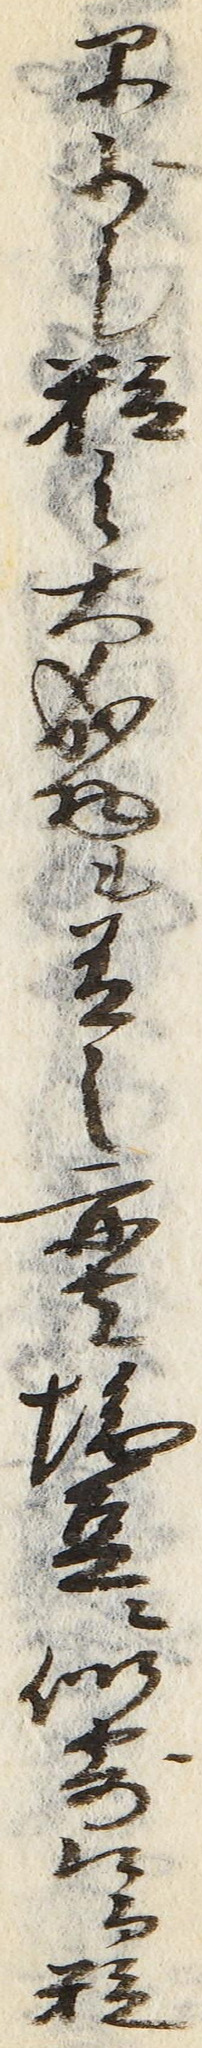品少し粒之大成物も有之亦者塩豆ニ似寄候而粒
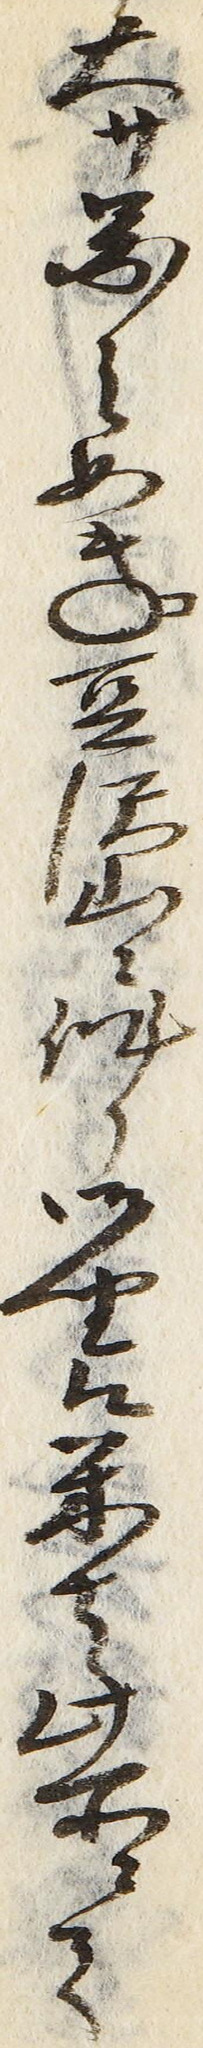大サ圖之如キ○豆沢山ニ作り御座候米者此所ニて
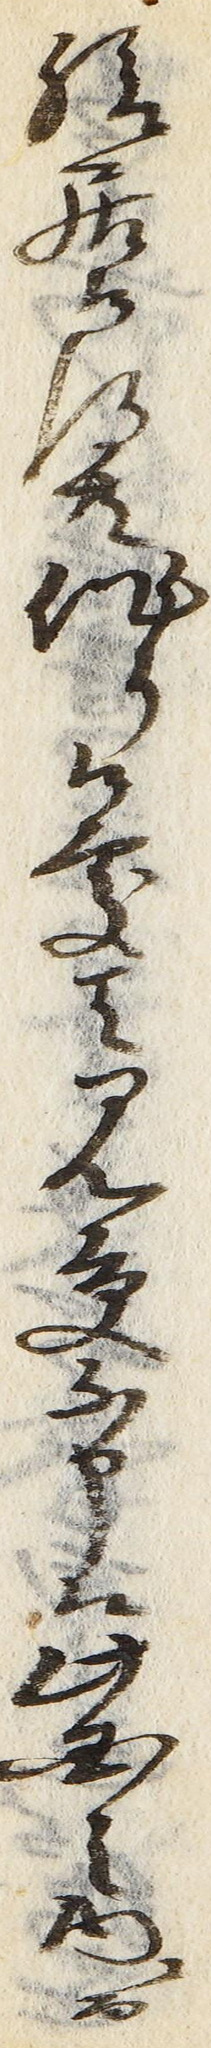給居候得共作り候所者見受不申此国之内ニ而
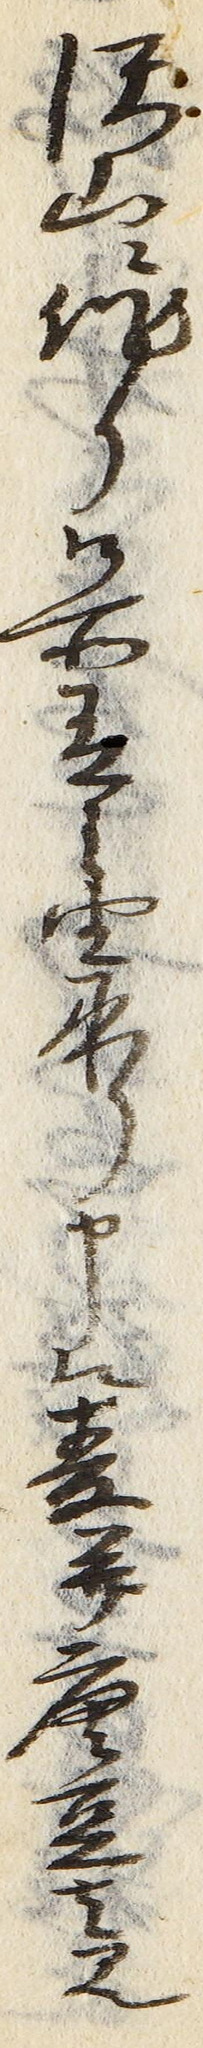沢山ニ作り候所有之由承り申候麦幷唐豆者見
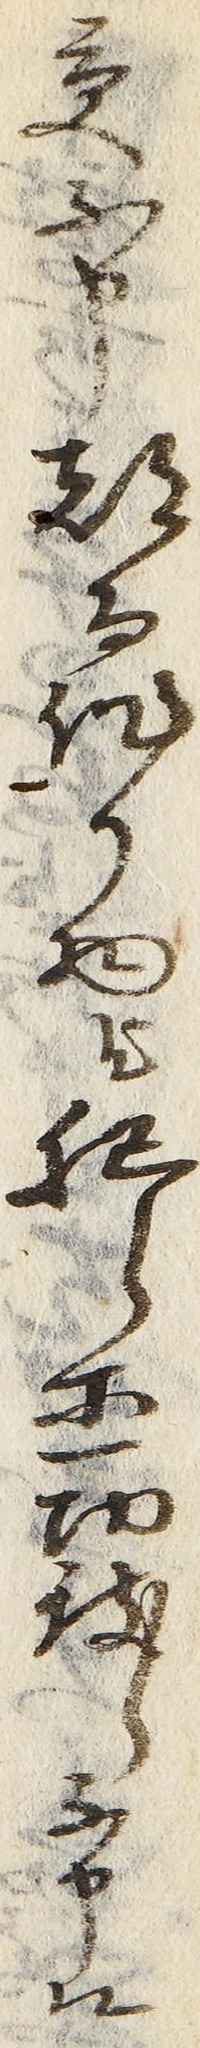受不申都而作り物江肥し等一切致し不申候
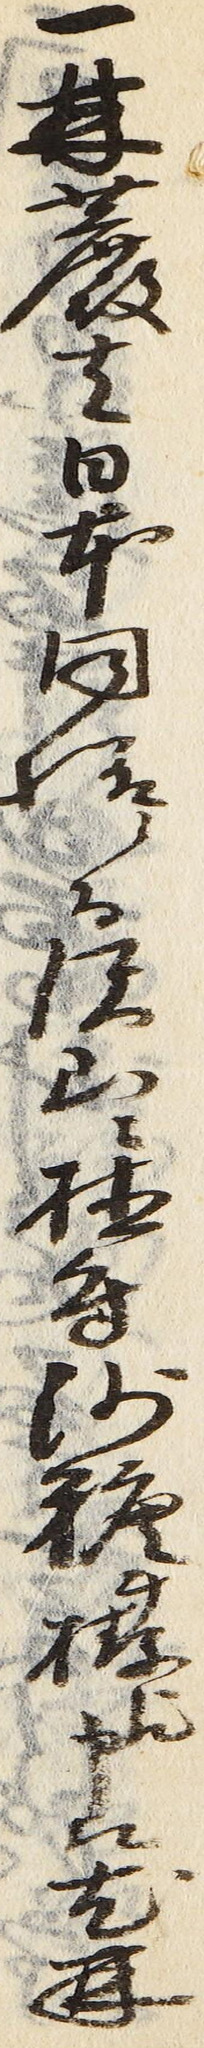一甘薦者日本同様ニ而沢山ニ植付砂糖ヲ拵江申候尤甘
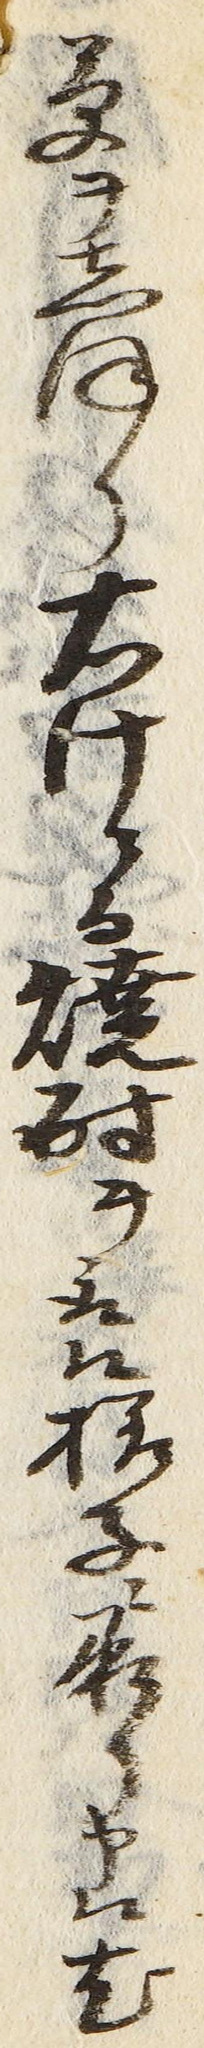草ヲしほり右汁ニ而焼酎ヲ取候様子ニ承り申候尤
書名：漂流人善助聞書
